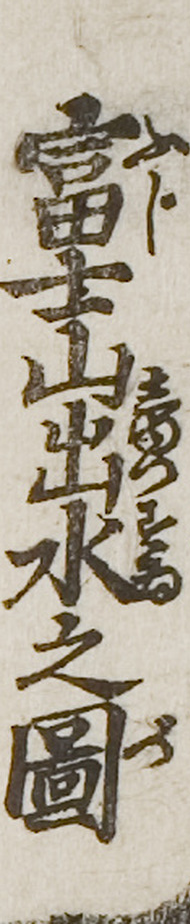富士山出水之圖
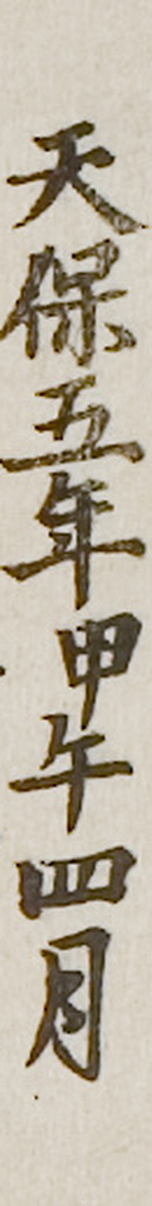天保五年甲午四月
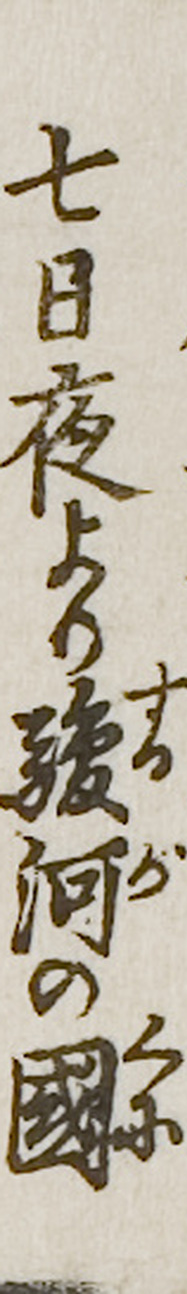七日夜より駿河の國
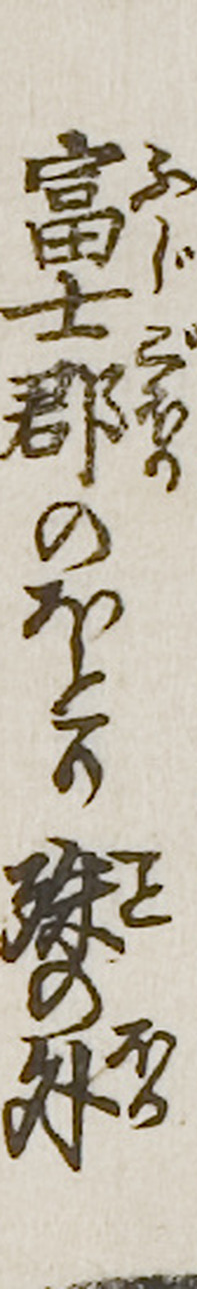富士郡のほとり殊の外
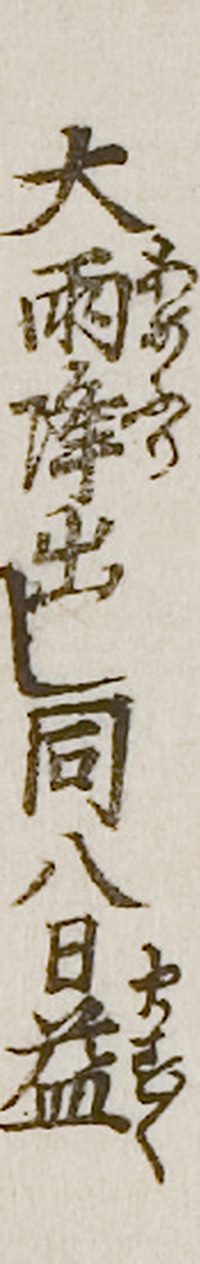大雨降出し同八日益
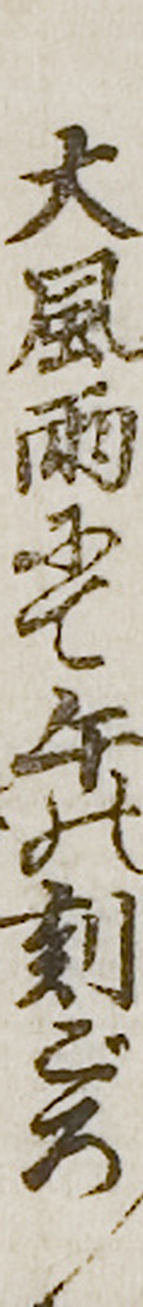大風雨にて午の刻ごろ
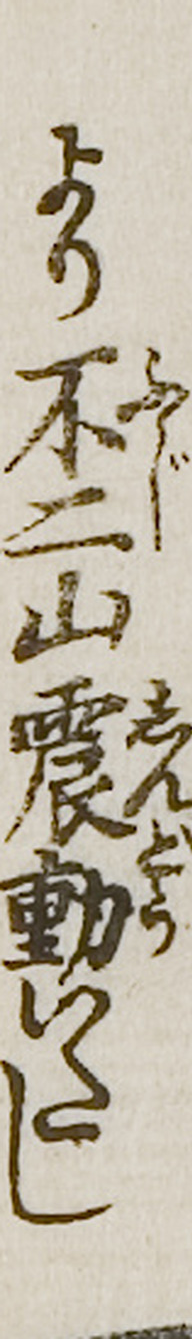より不二山震動いたし
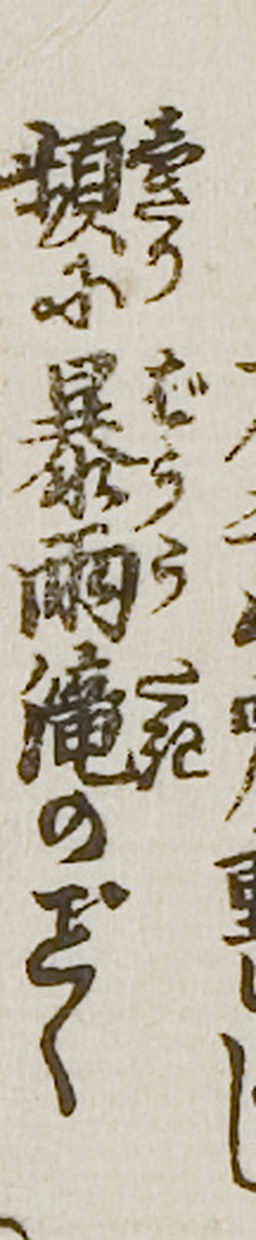頻に暴雨滝のごとく
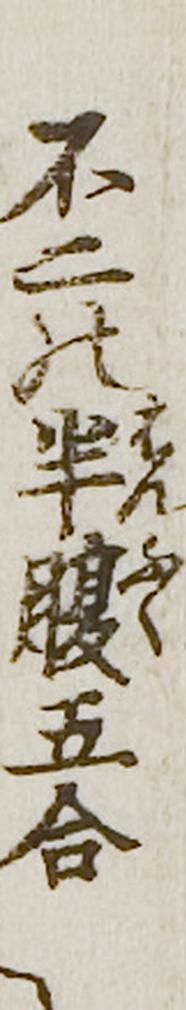不二の半腹五合
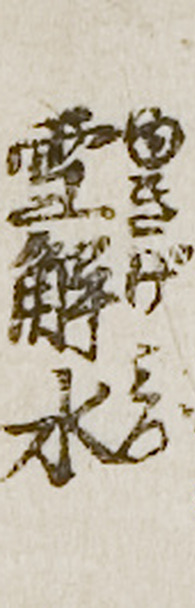雪解水
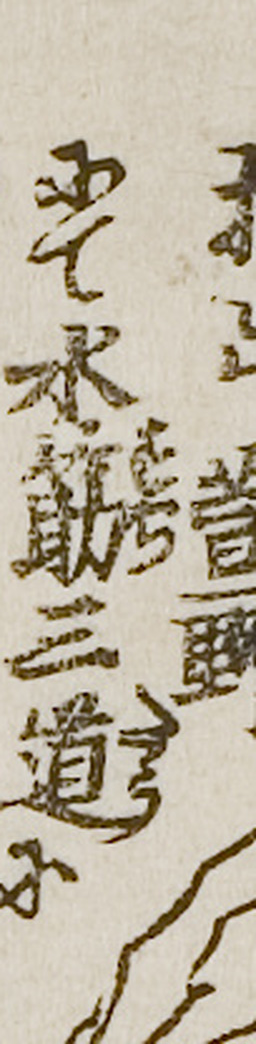にて水筋三道に
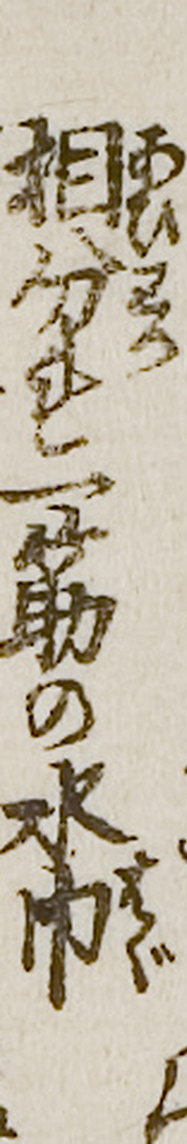相分れ一筋の水巾
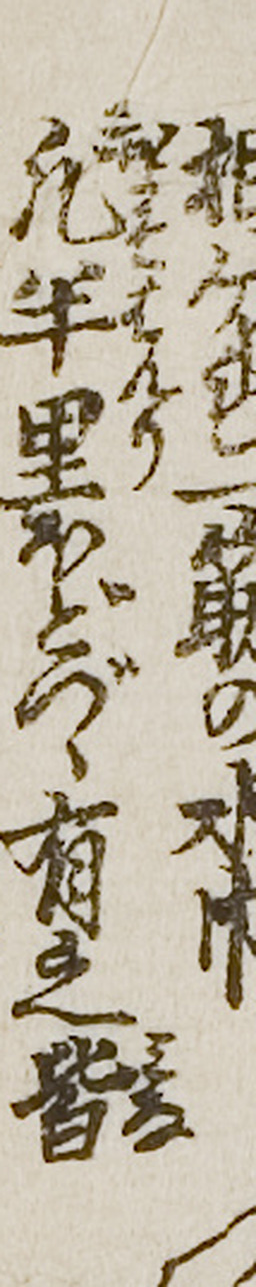凢半里ほどづゝ有之皆
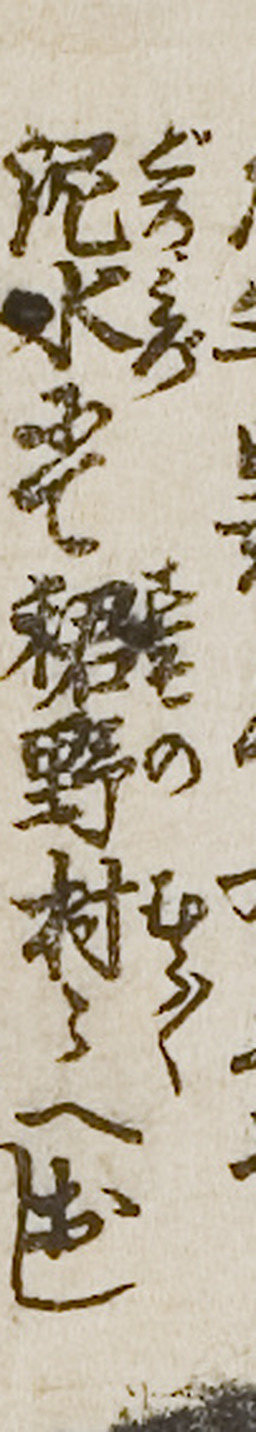泥水にて裾野村〻へおし
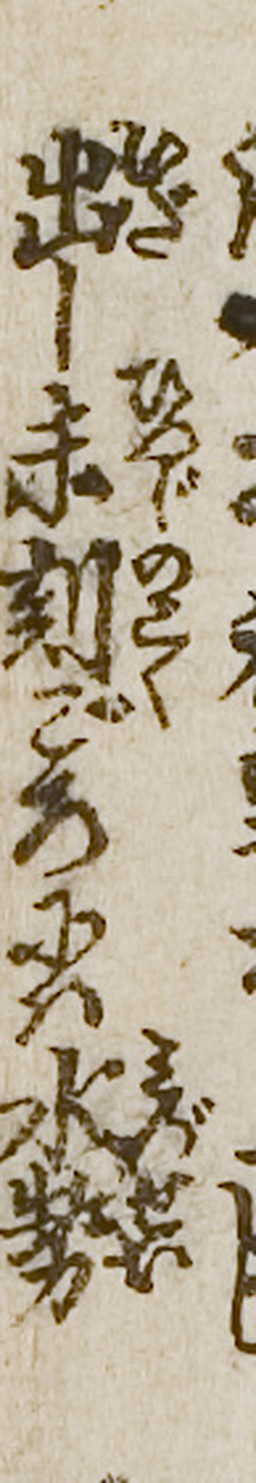出し未刻ごろにハ水勢
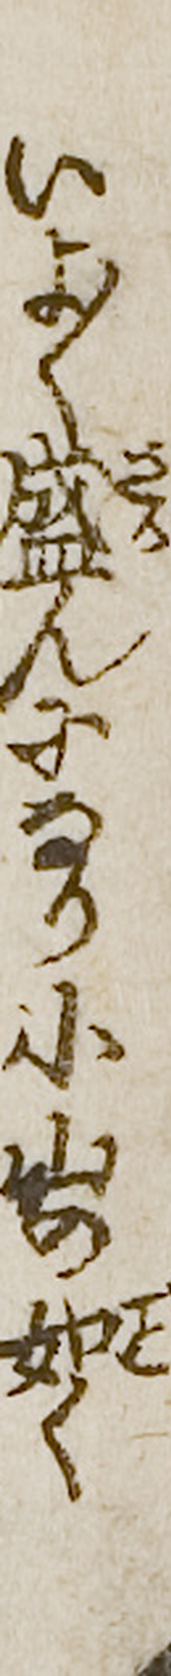いよ〳〵盛んになり小山の如く
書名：富士山出水之図
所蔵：東京大学総合図書館 General Library in the University of Tokyo, JAPAN
